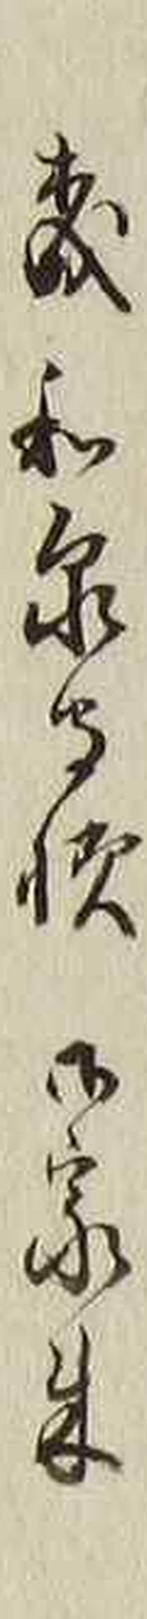森和泉守様御家来
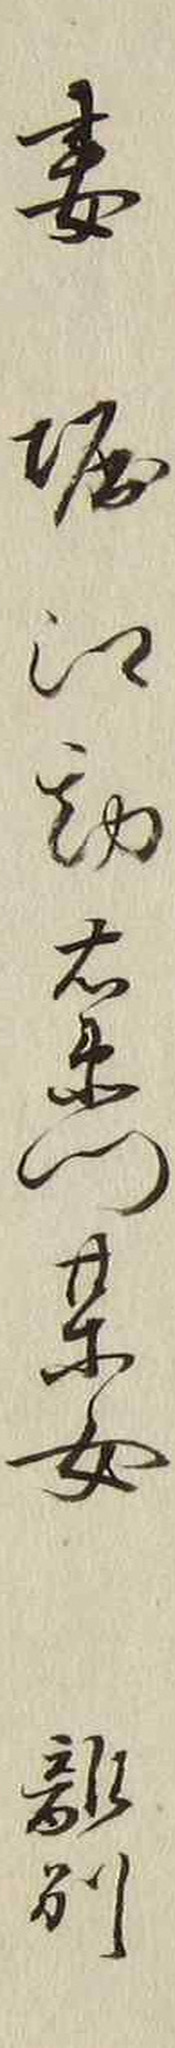妻堀江勘右衛門某女離別
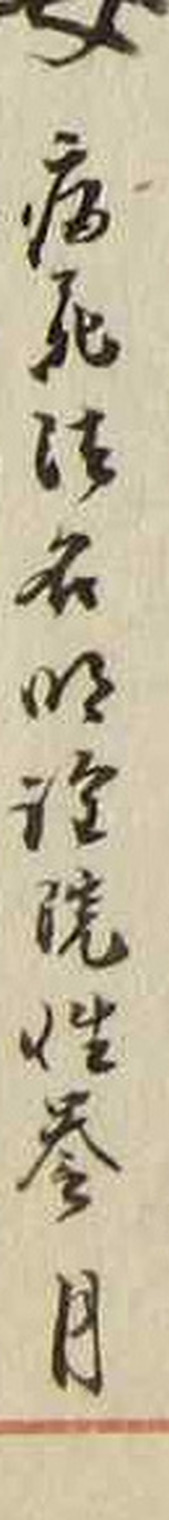病死法名明詮院姓誉月
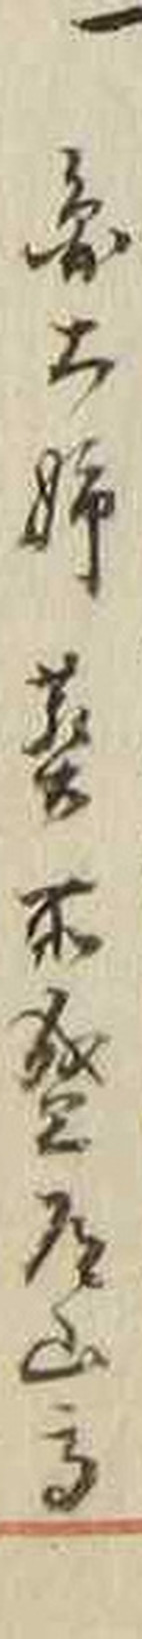円大姉葬所盛道山高

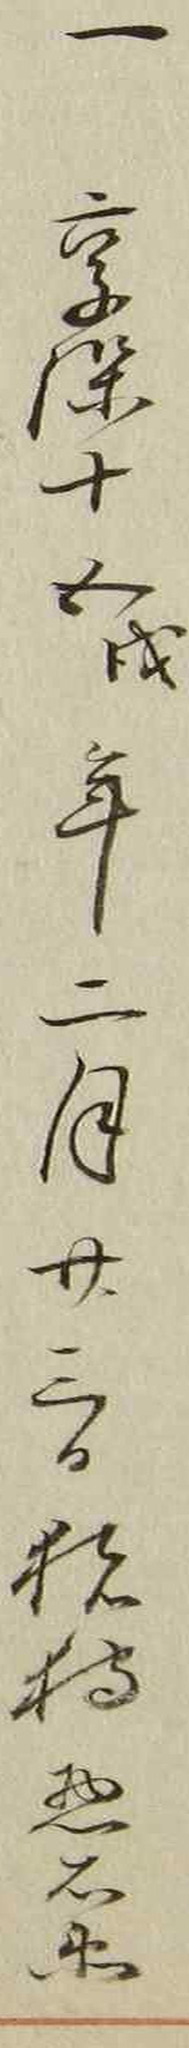一享保十五戌年二月廿三日猪狩惣右衛
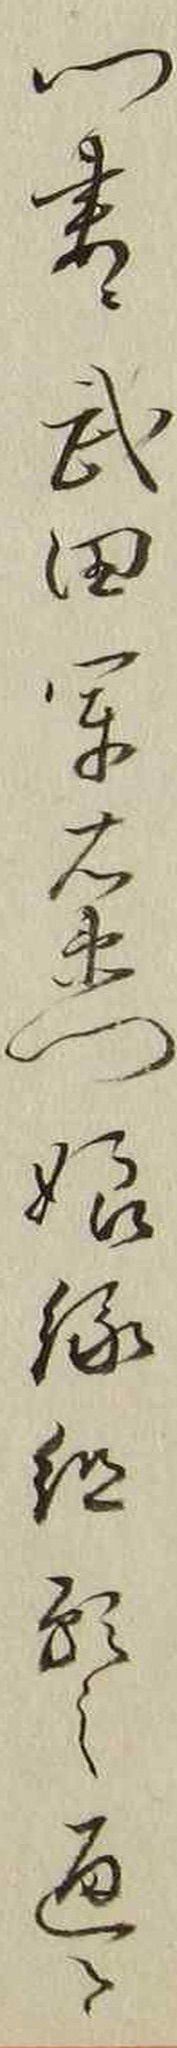門妻ニ武田軍右衛門娘縁組願之通と
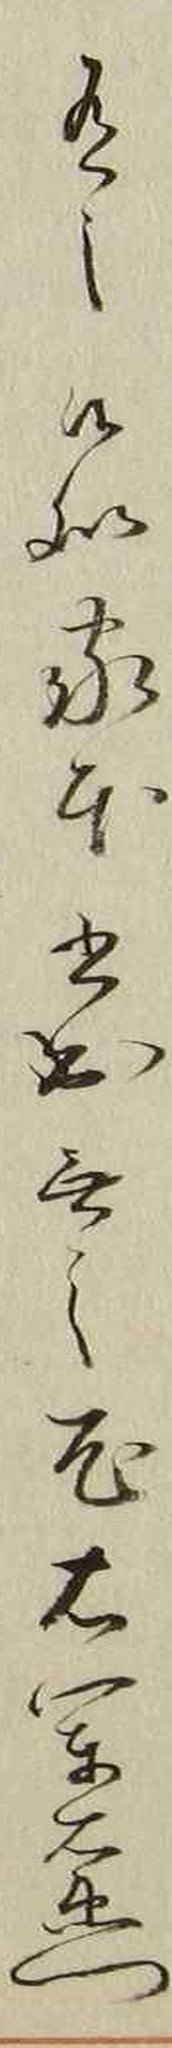有之候処家本書出無之尤右軍右衛門
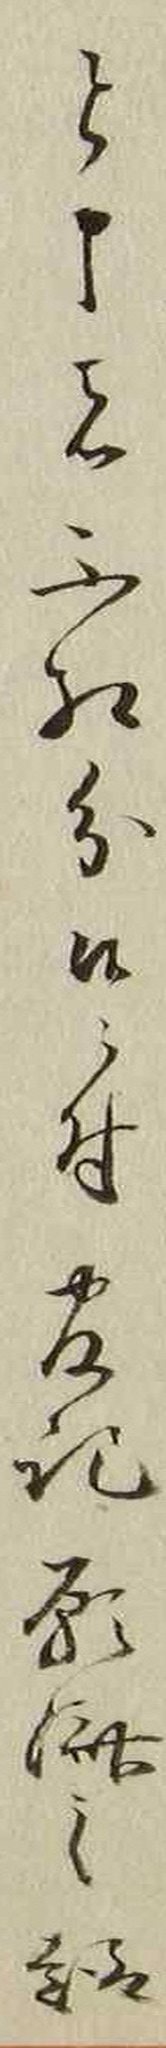と申者不相分候ニ付官記願済之趣
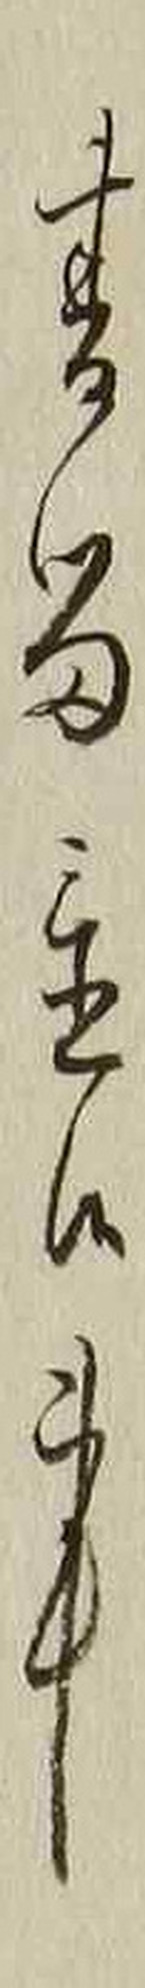書留置候事
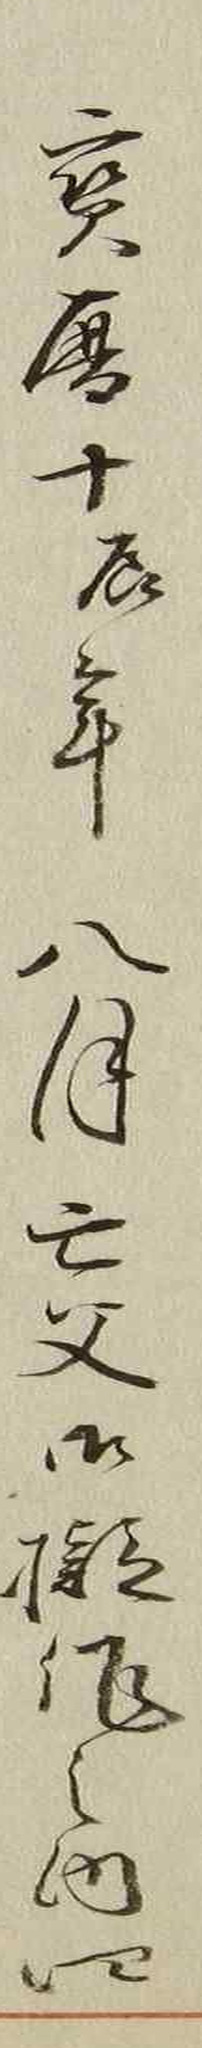一宝暦十辰年八月亡父御擬作之内四
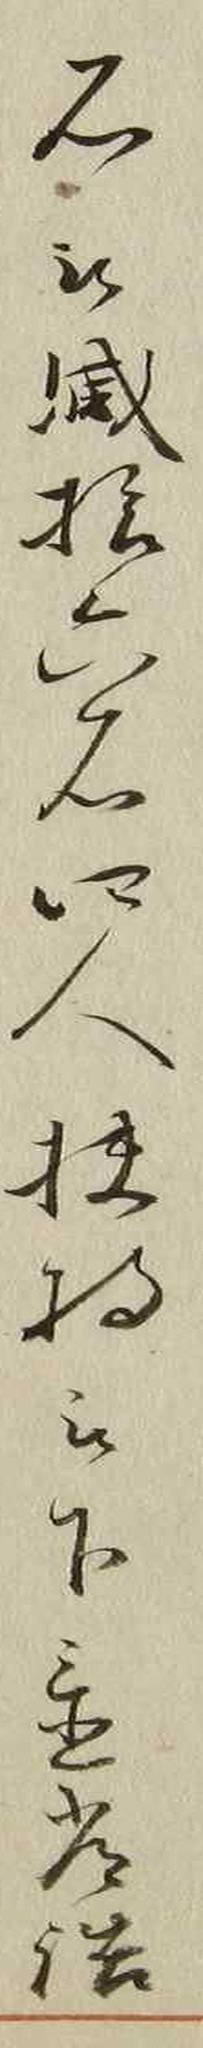石被減拾六石四人扶持被下置常詰
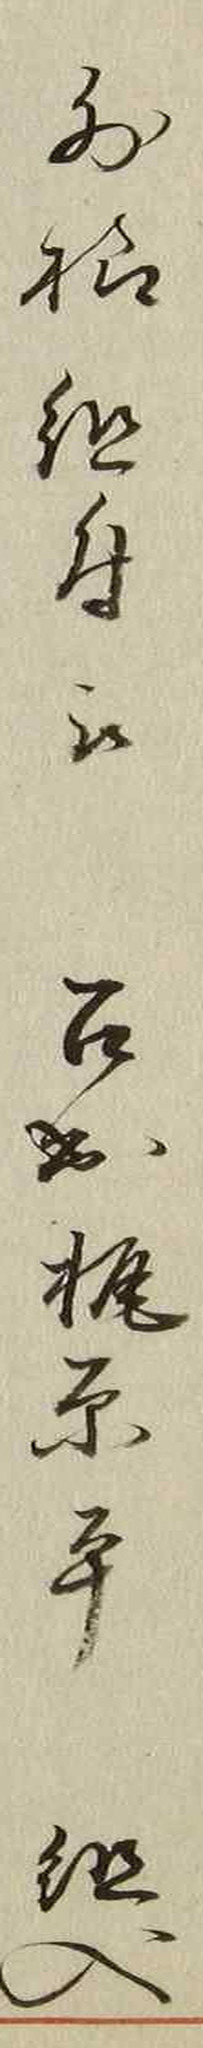外様組付被召出梶原平組へ入
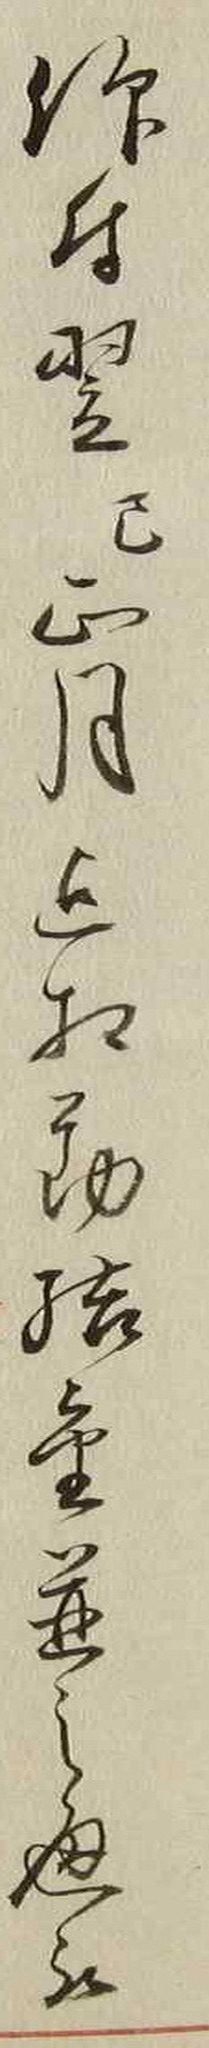仰付翌巳正月迄相勤結金並之通被
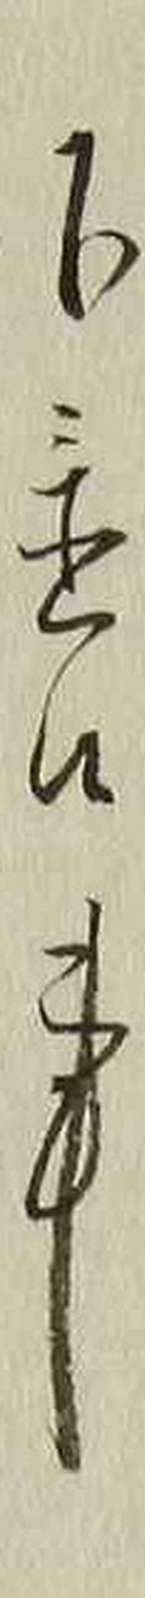下置候事
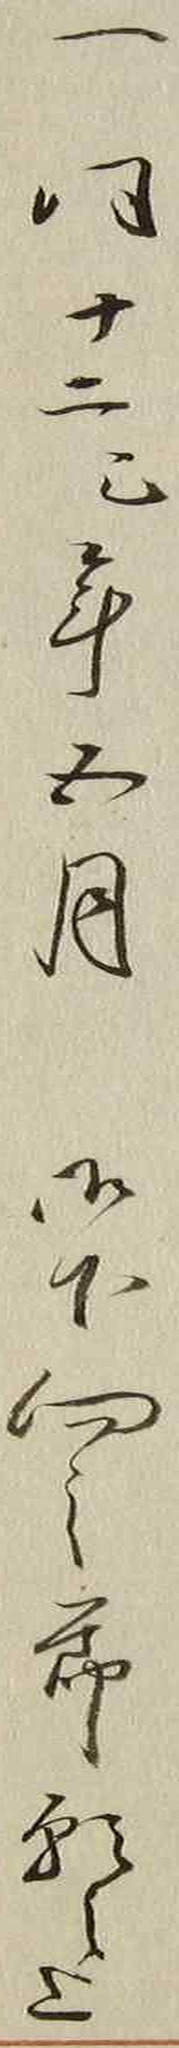一同十二巳年五月御下向之節願之上
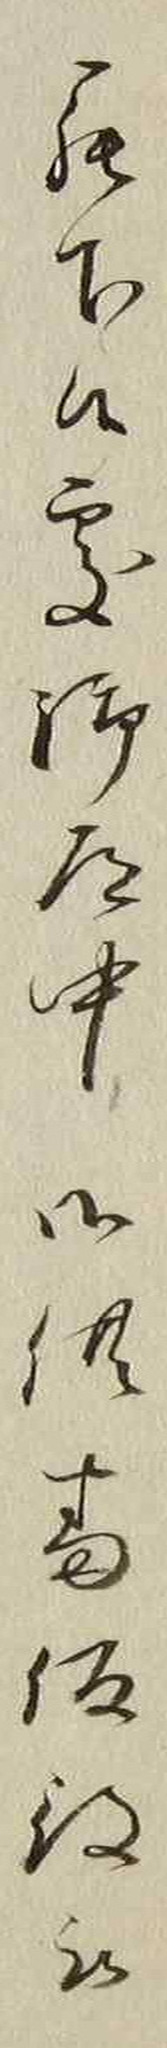罷下候処御道中御供番仮役被
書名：諸士系譜　巻之28　い之部28
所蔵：会津若松市立会津図書館
